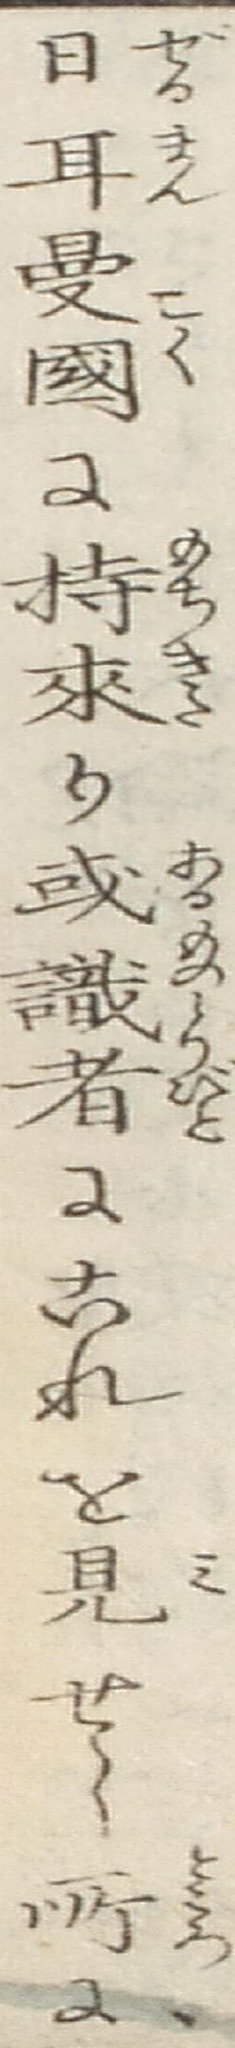日耳曼国に持来り或識者にこれを見せし所に、
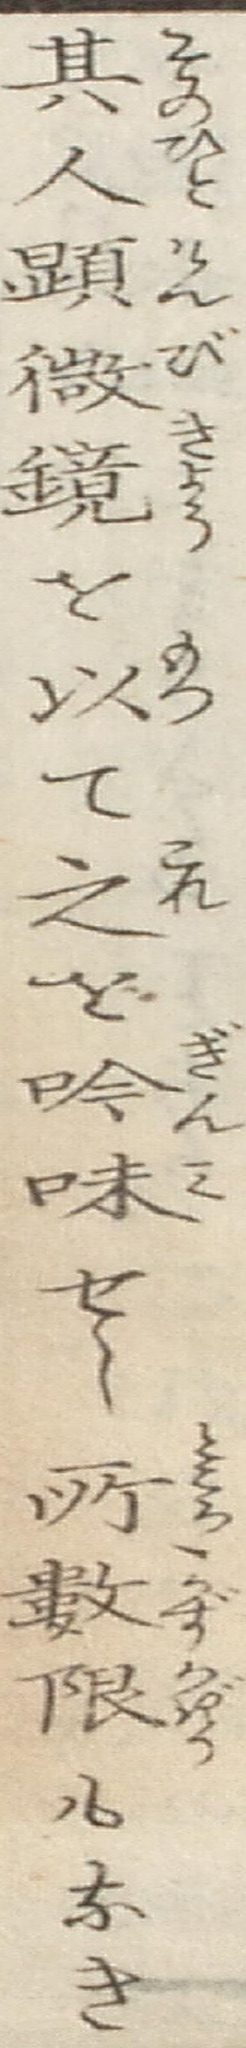其人顕微鏡を以て之を吟味せし所、数限もなき
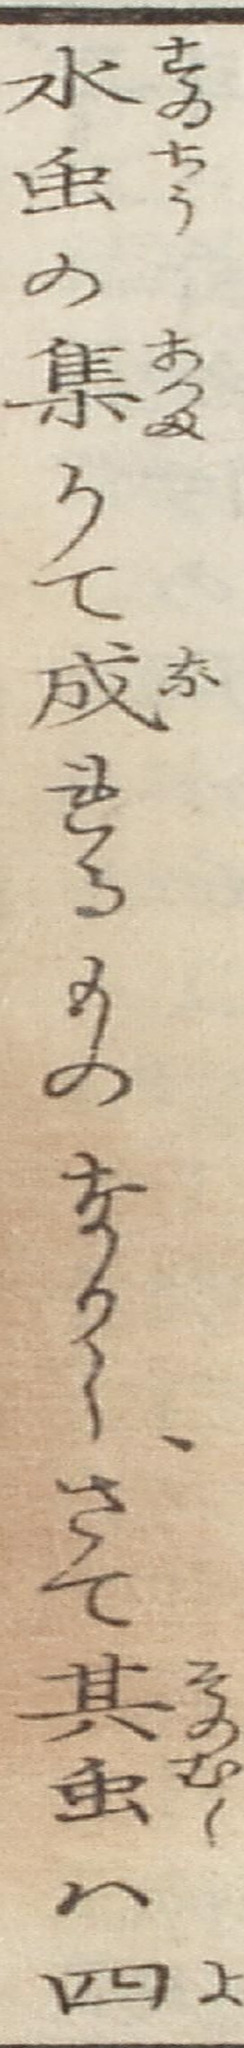水虫の集りて成れるものなりし、さて其虫は四
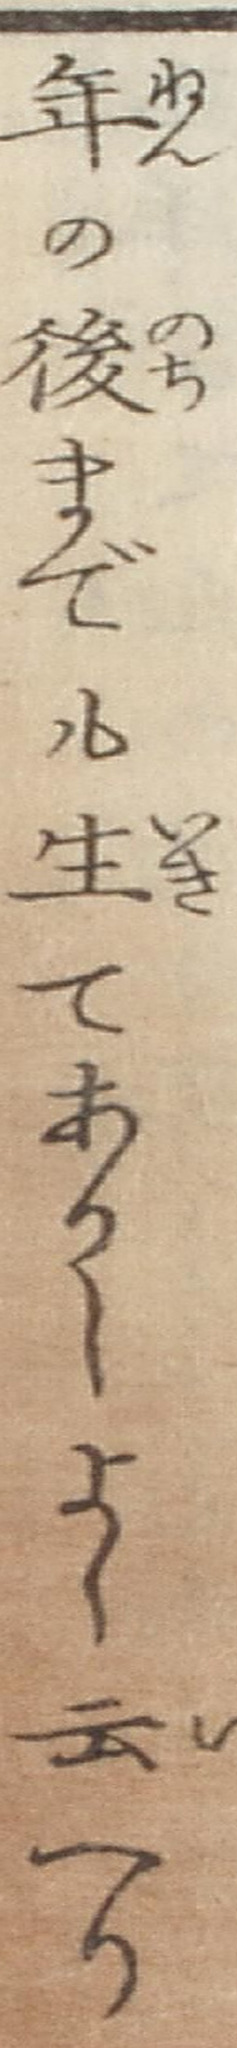年の後までも生てありしよし云へり
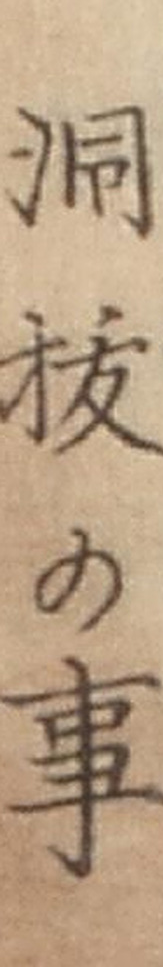洞抜の事
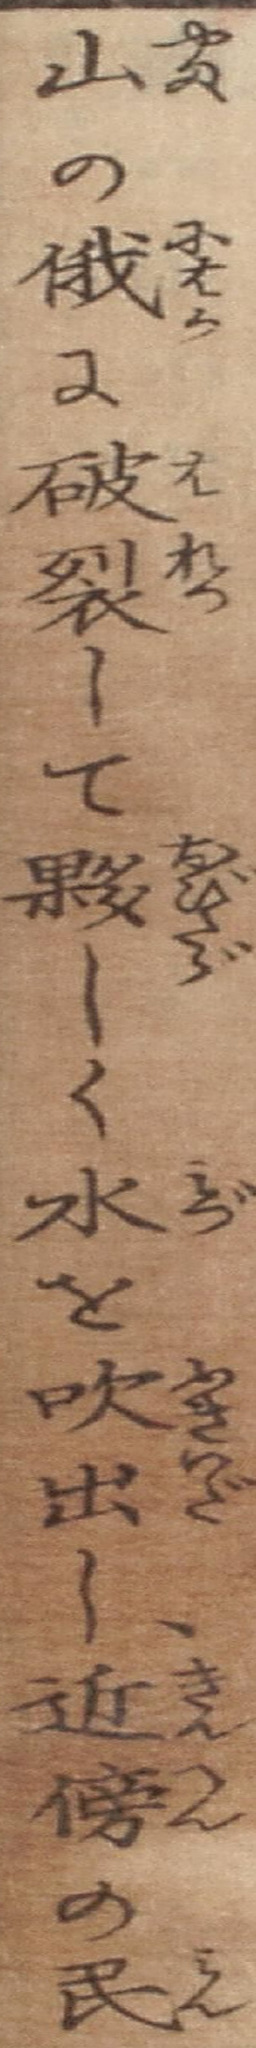山の俄に破裂して夥しく水を吹出し、近傍の民
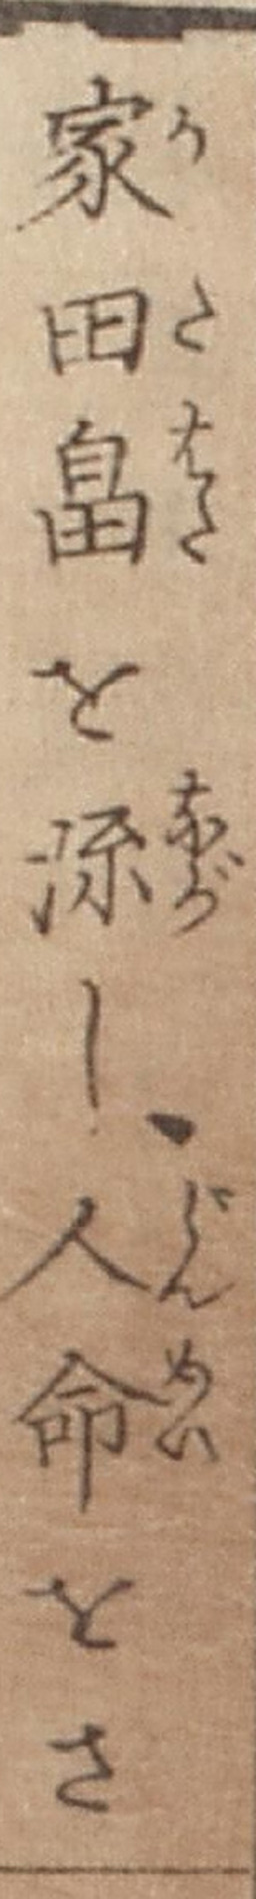家田畠を流し、人命をさ
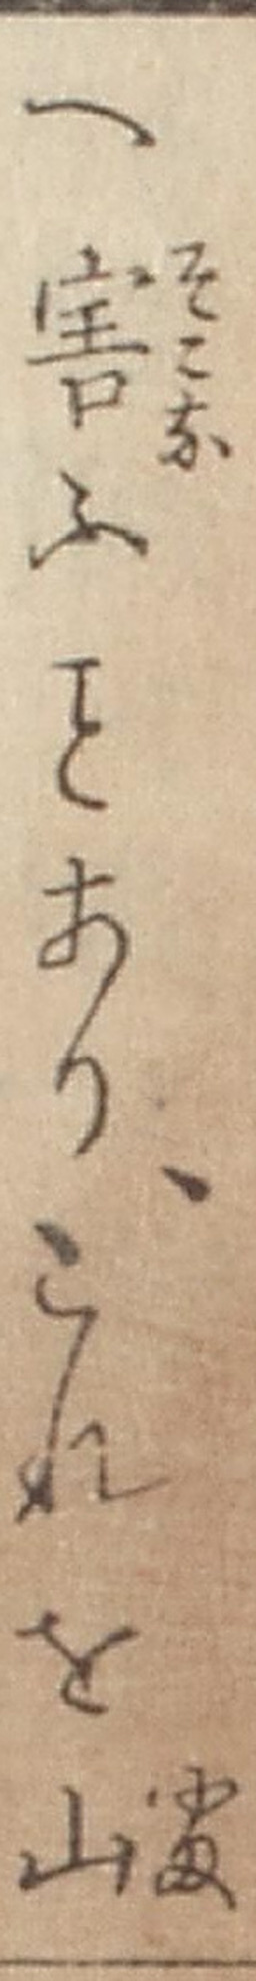へ害ふことあり、これを山
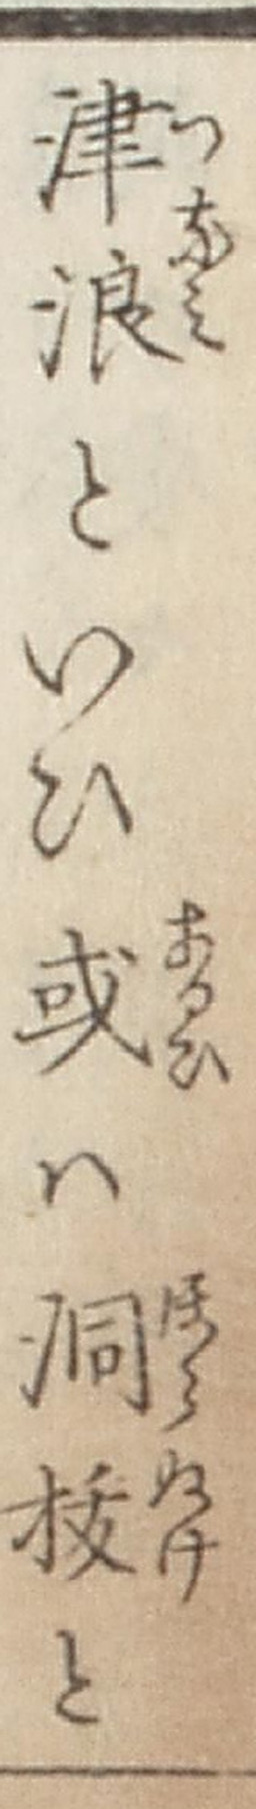津浪といひ或は洞抜と
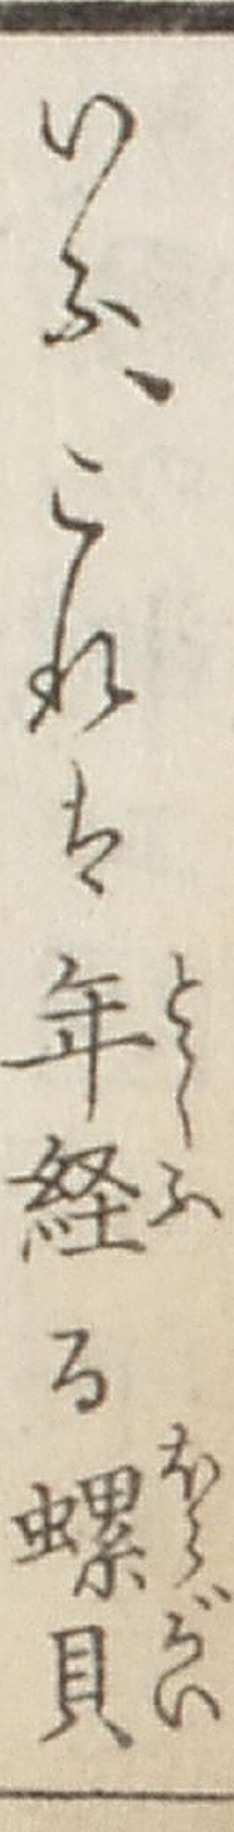いふ、これは年経る螺貝
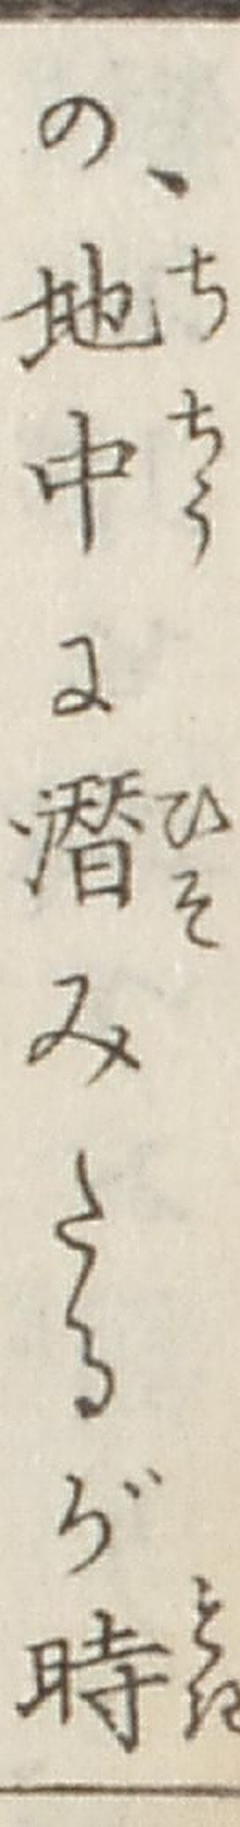の、地中に潜みたるが時
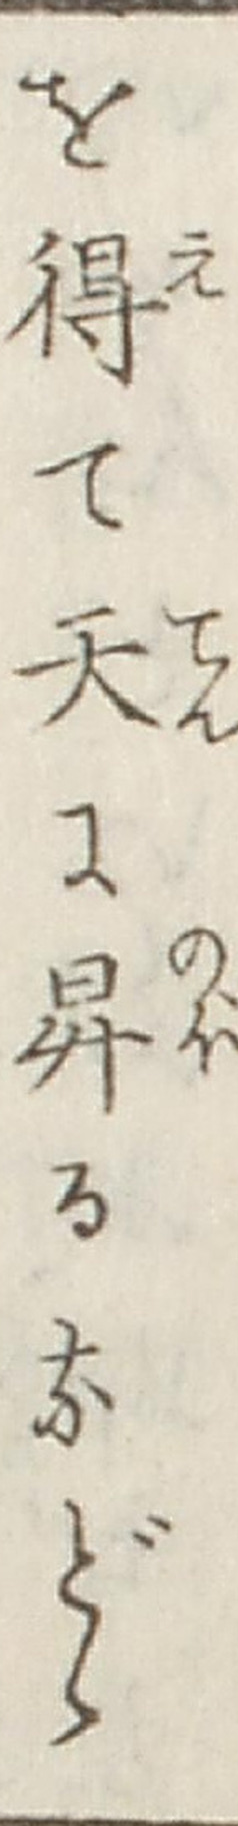を得て天に昇るなどゝ
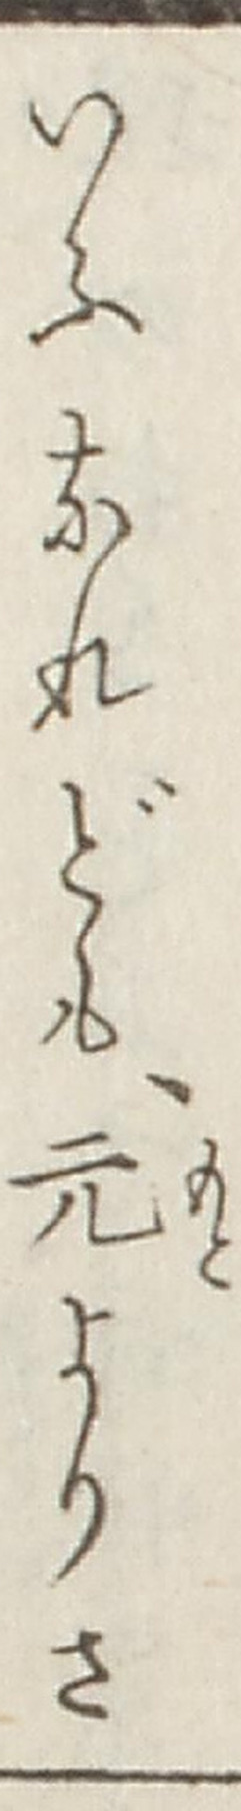いふなれども、元よりさ
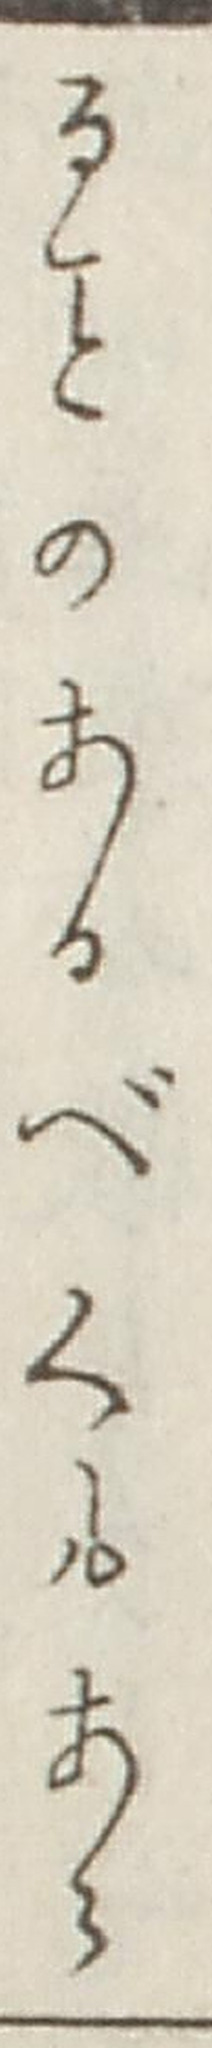ることのあるべくもあら
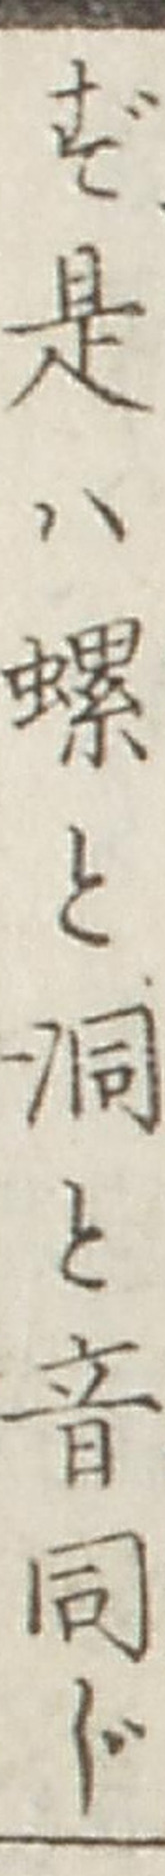ず、是は螺と洞と音同じ

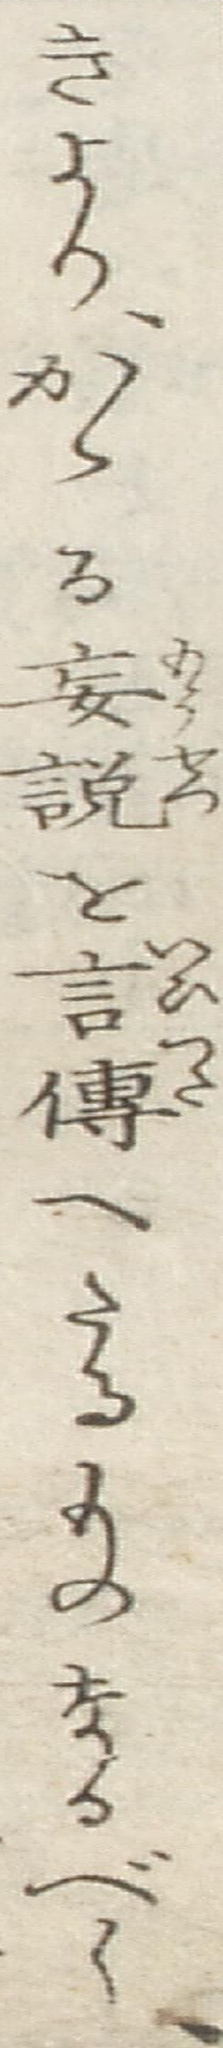きより、かゝる妄説を言伝へたるものなるべし、
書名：変異辯　一名、天變地異拾遺　全
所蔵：東京大学地震研究所図書室 Earthquake Research Institute Library, The University of Tokyo, JAPAN
